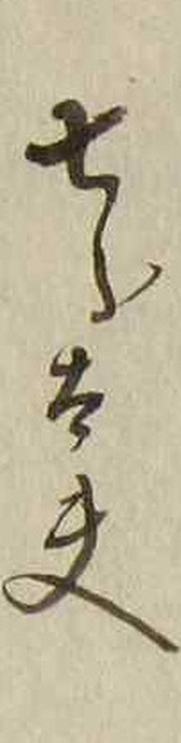七郎太夫

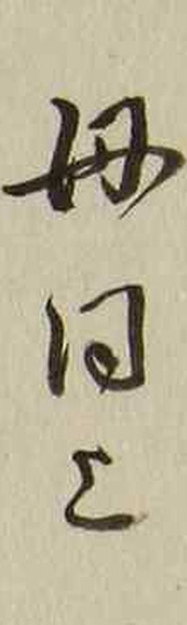母同上
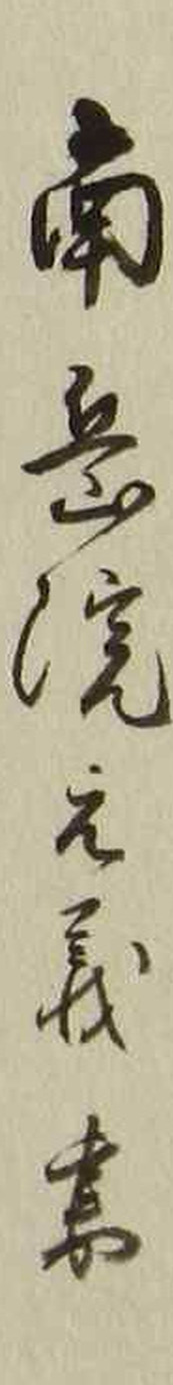女南岳院元義妻
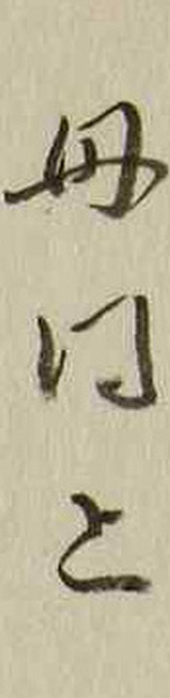母同上
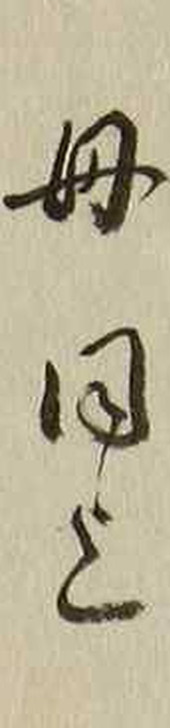母同上
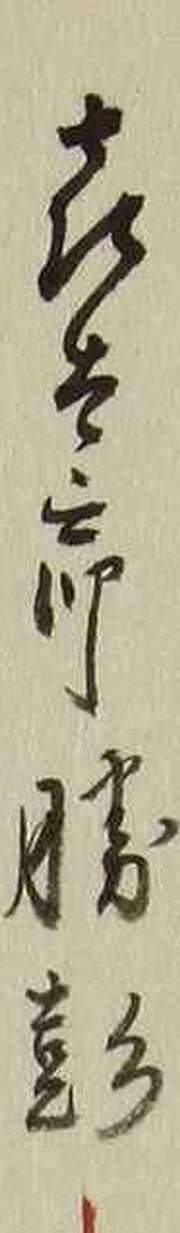喜太郎勝彭
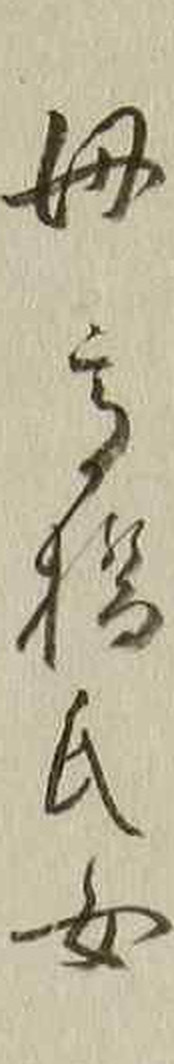母高橋氏女
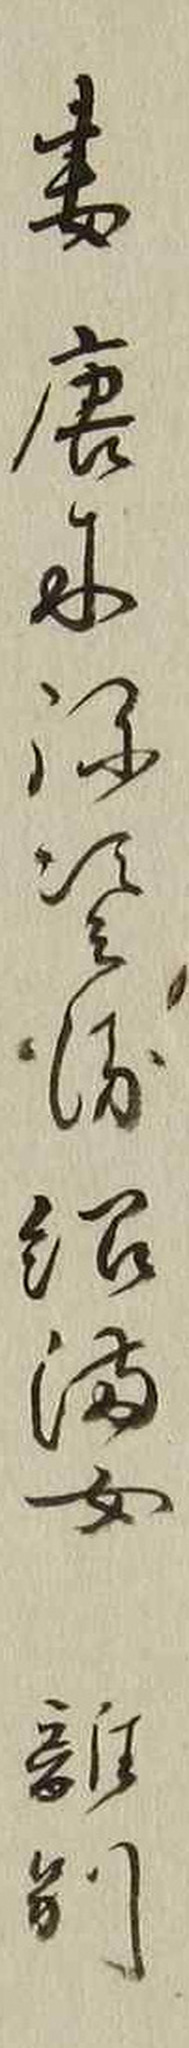妻唐木弥次兵衛紹満女離別
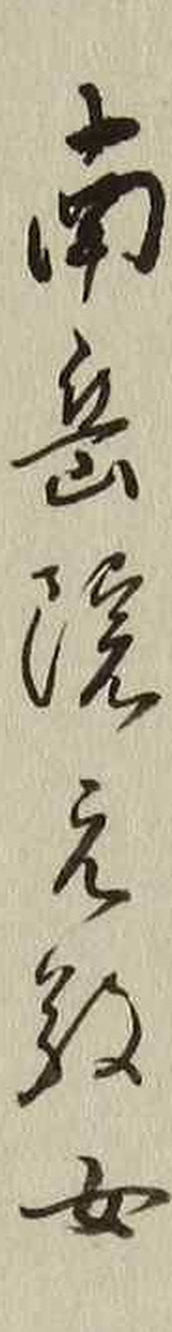南岳院元敬女
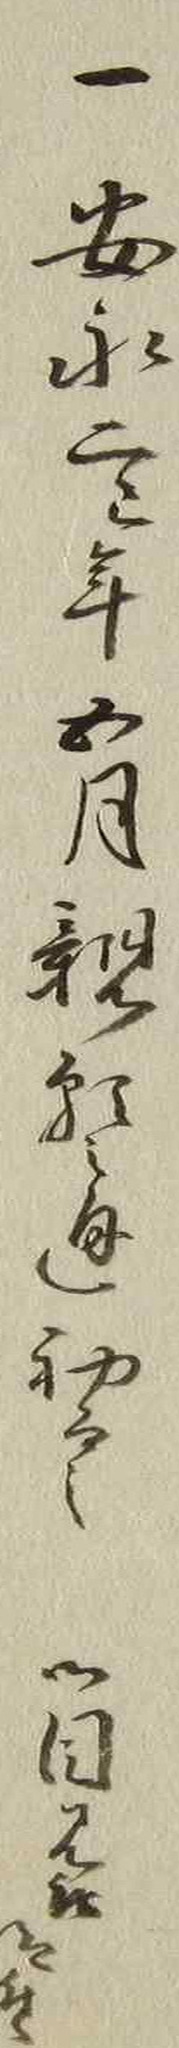一安永二巳年五月親願之通初而之御目見被仰付候事
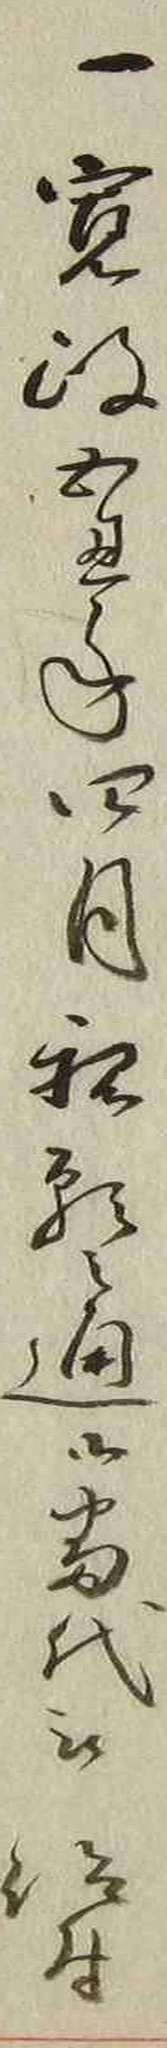一寛政五午年四月親願之通御番代被仰付
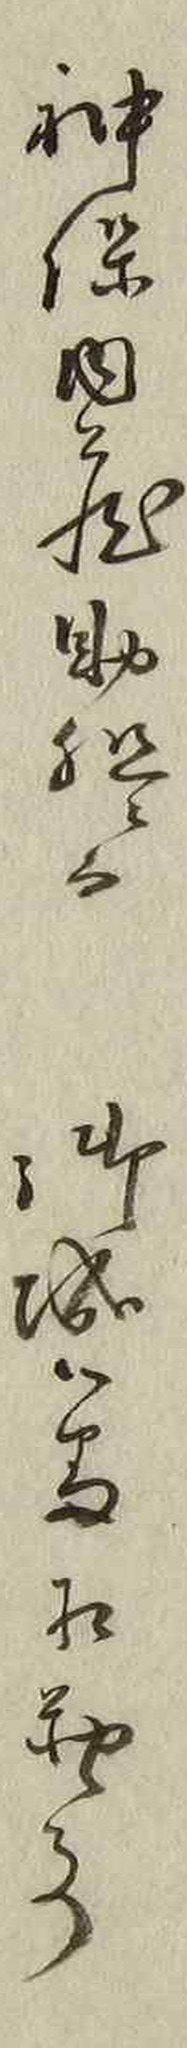神保内蔵助組に而御城御番相勤候事
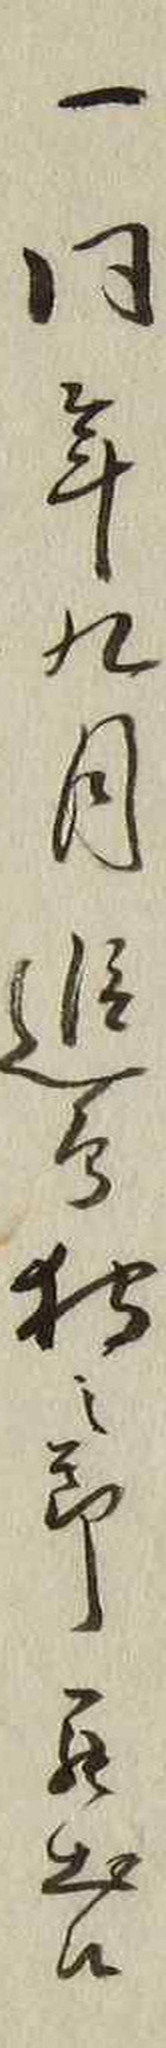一同年九月追鳥狩之節罷出候
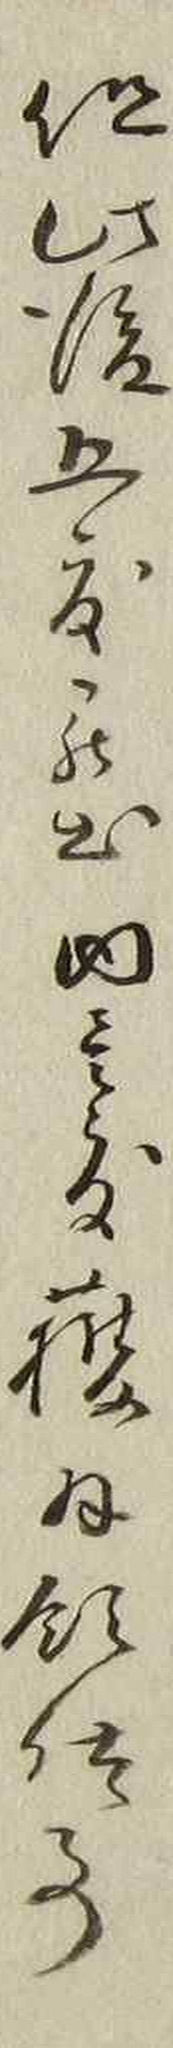但此後五度罷出内壱度獲物領仕候事
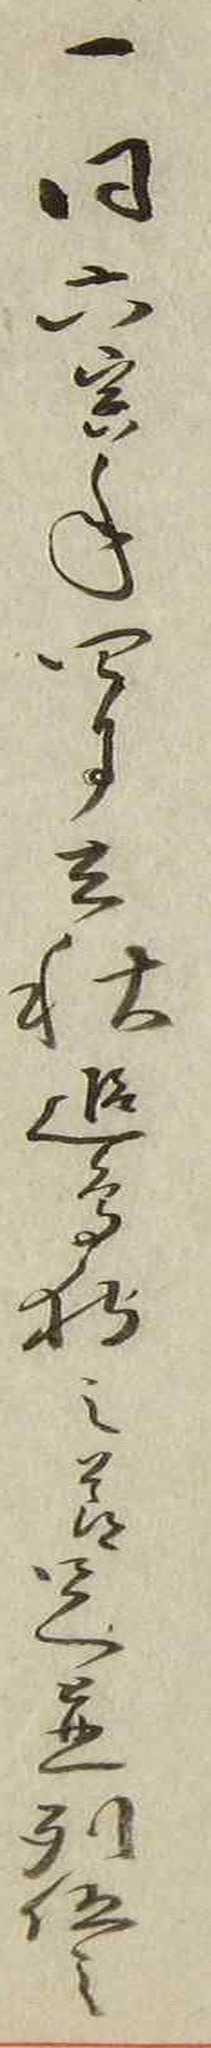一同六寅年四月去秋追鳥狩之節足並列伍之
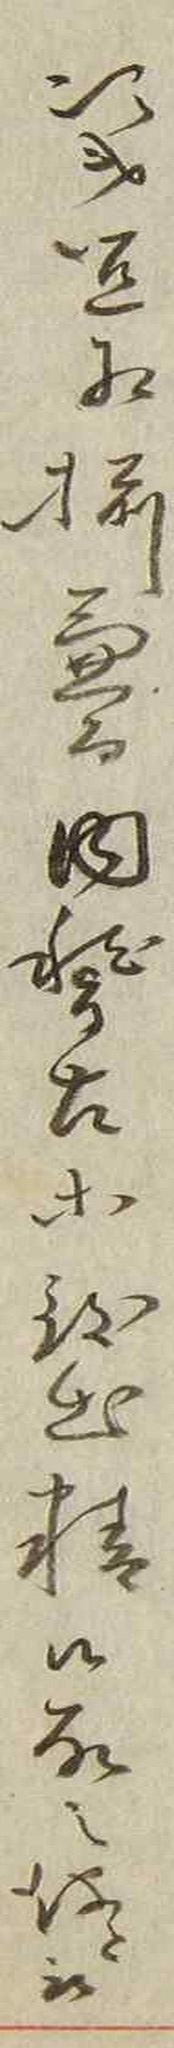次第宜相揃兼而内稽古等致出精候処之儀と被
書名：諸士系譜　巻之6　い之部6
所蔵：会津若松市立会津図書館
